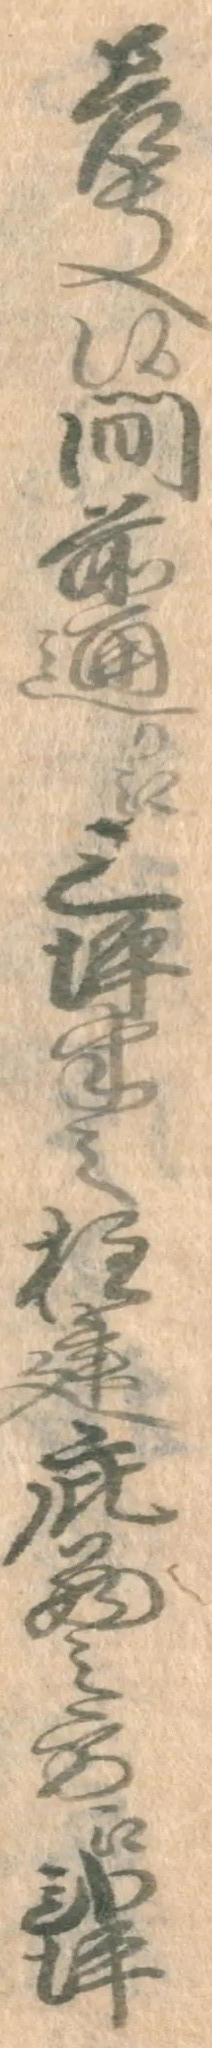差支候間前通り江三坪半之柱建庇西之方江弐坪
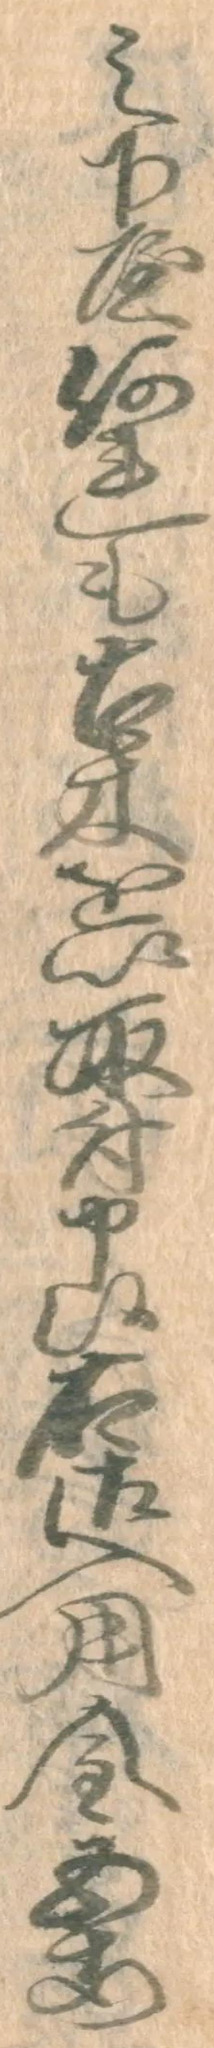之下屋何れも古木を以右取付申候右御入用金五両
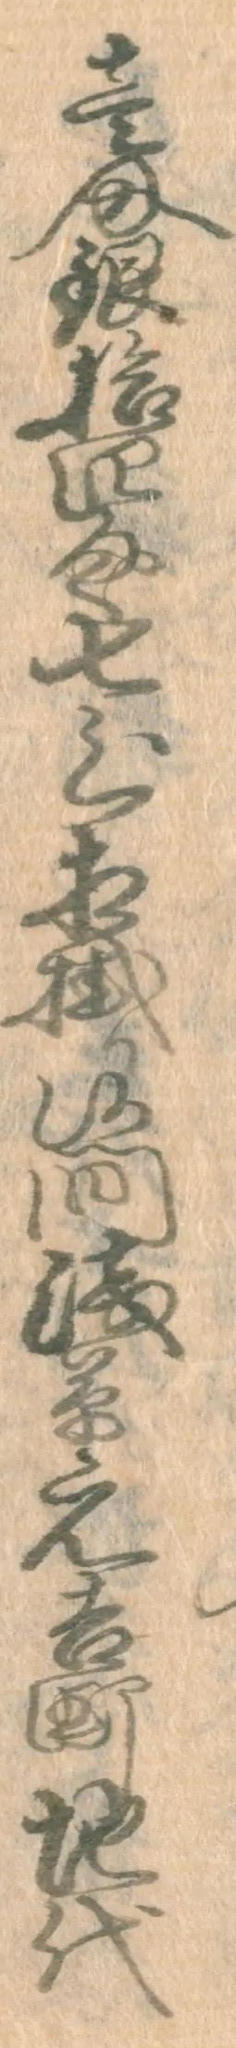壱分銀拾四匁七分相掛り候間浅草元吉町地代
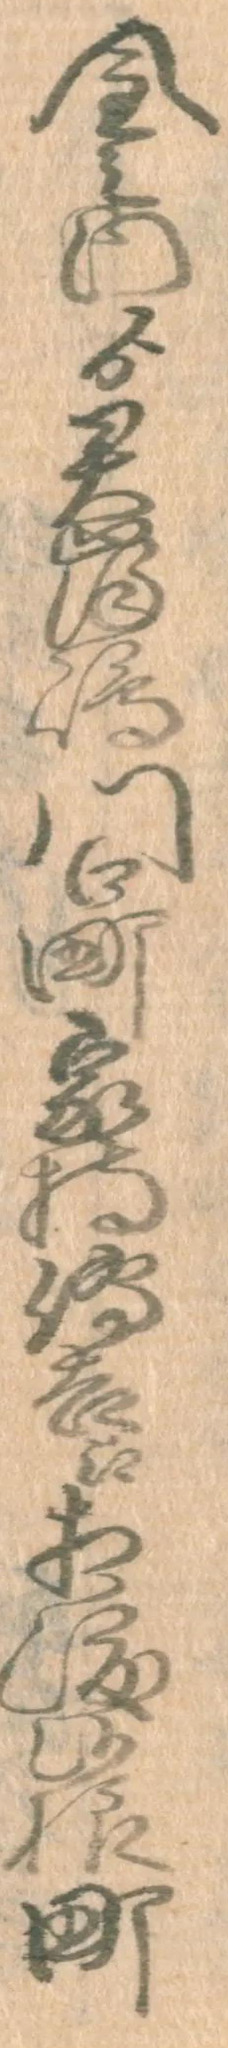金之内ゟ霊岸島川口町家持伝吉江相渡候様町
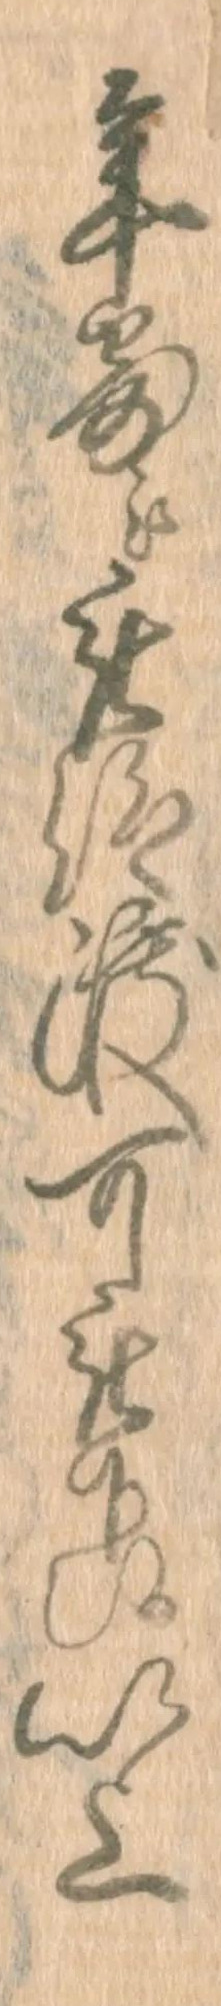年寄江被仰渡可被下候以上
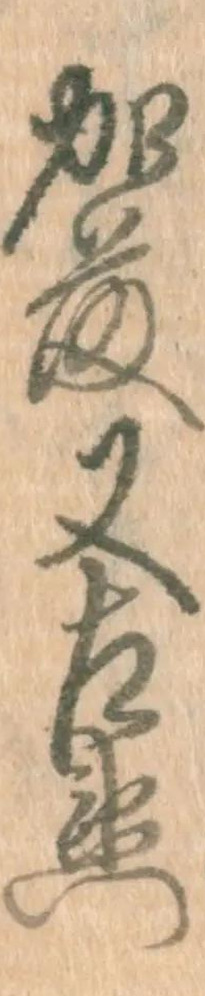加藤又左衛門
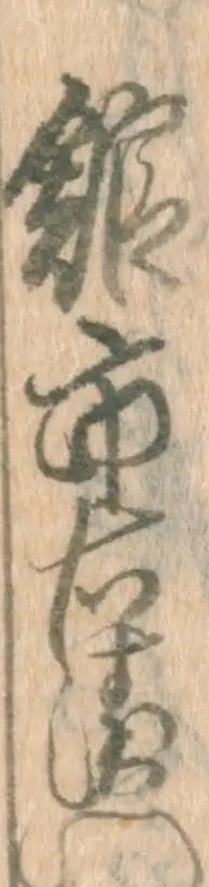舘市右衛門
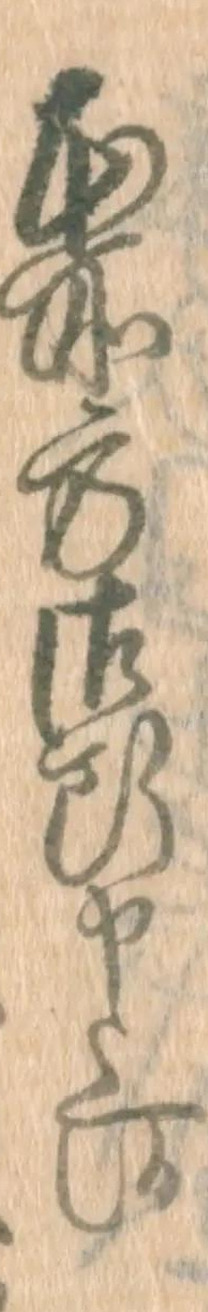本所方御断申上候
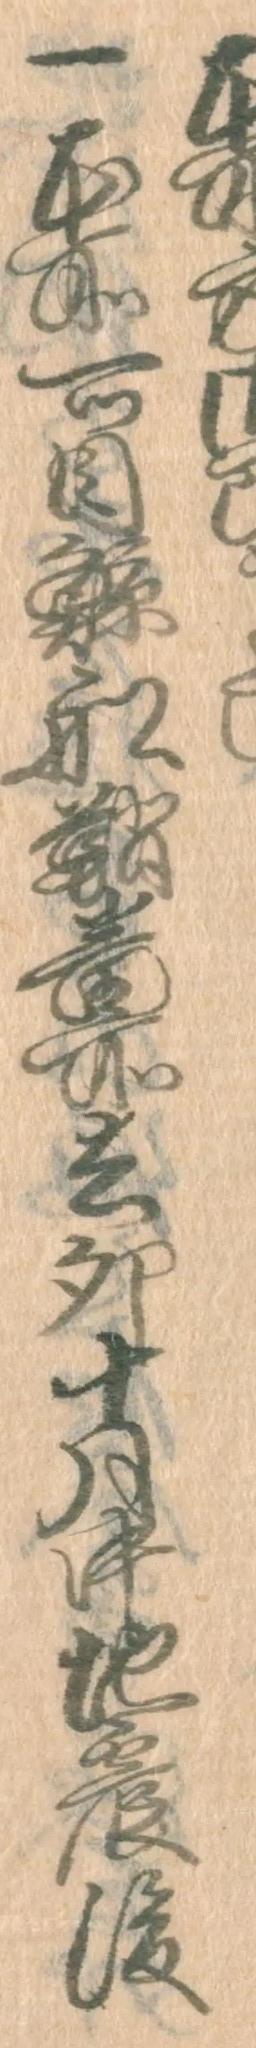一本所一ツ目鯨船鞘番所去卯十月中地震後
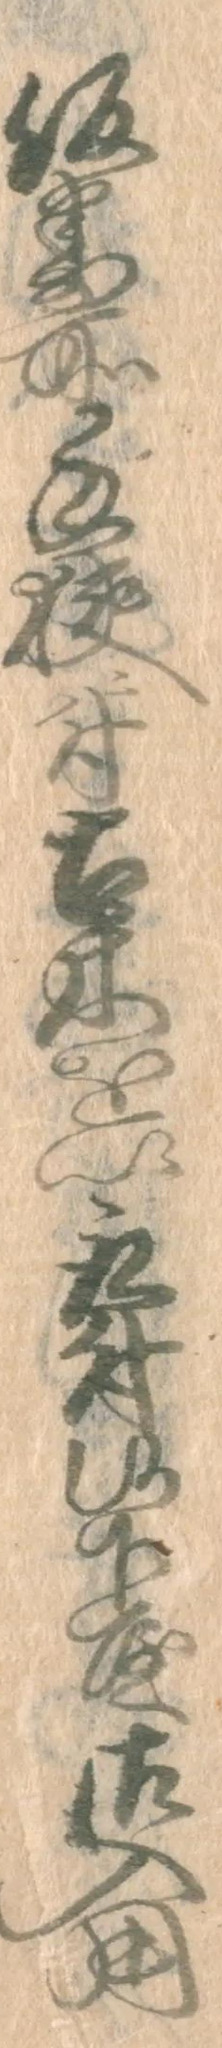仮番所手狭ニ付古木を以取付候下屋御入用
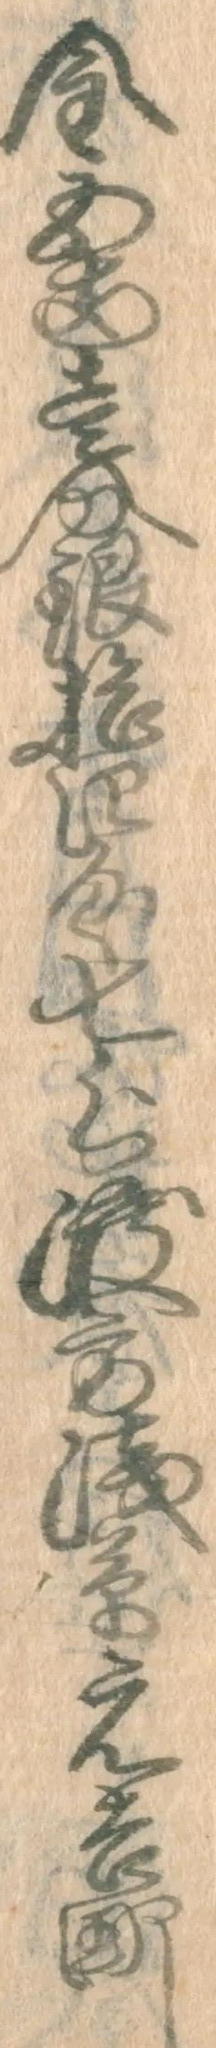金五両壱分銀拾四匁七分渡方浅草元吉町

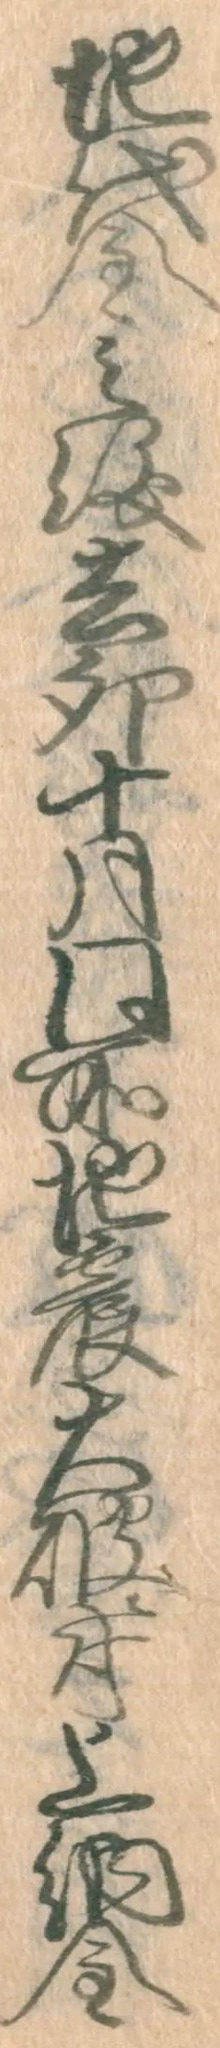地代金之儀去卯十月同所地震大破ニ付上納金
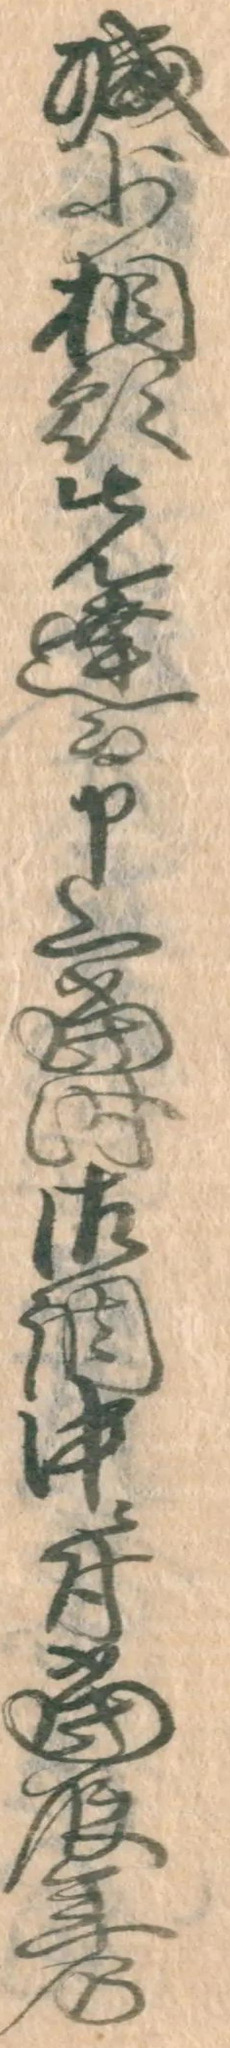減少相願先達而申上当時御調中ニ付当辰年分
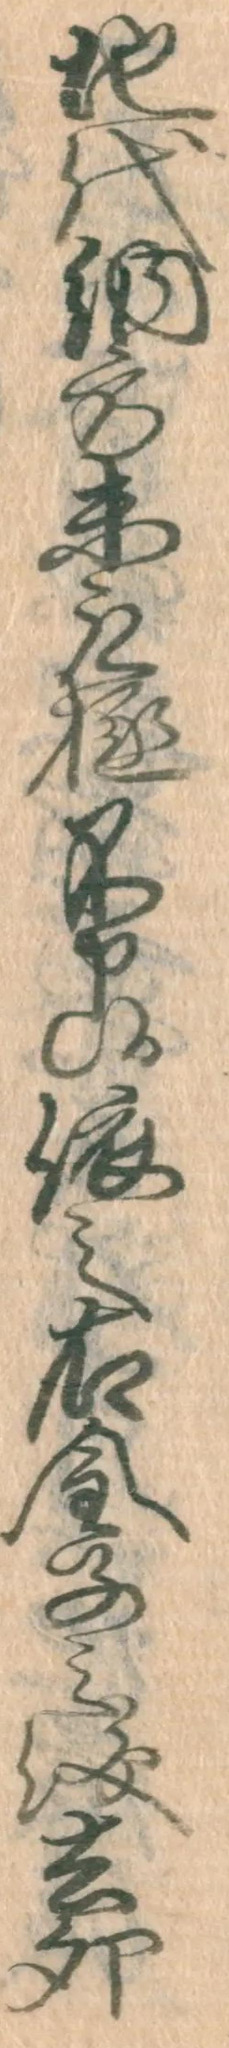地代納方未取極不申候依之右金子之儀去卯
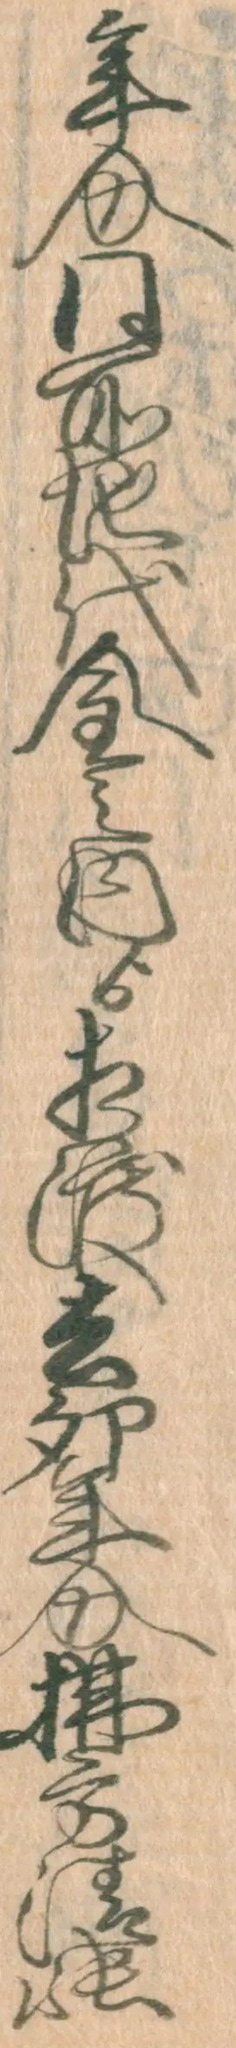年分同所地代金之内ゟ相渡去卯年分払方清帳
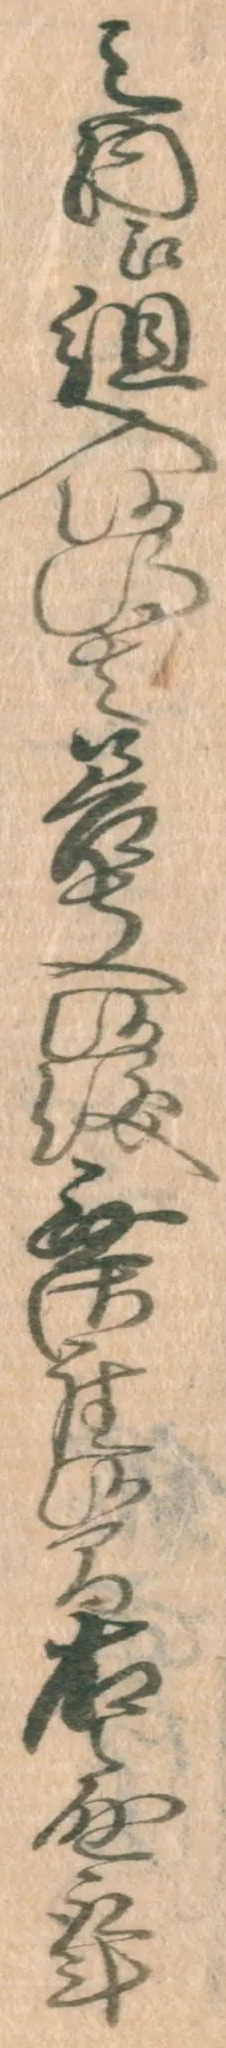之内江組入候得は差支候儀無御座候間右之通取計
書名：地震災書留 2巻. [1] 内表紙に「地震災書留　安政二卯年　但本所深川御用屋敷地代免除調」とあり
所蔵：国立国会図書館 National Diet Library, JAPAN
